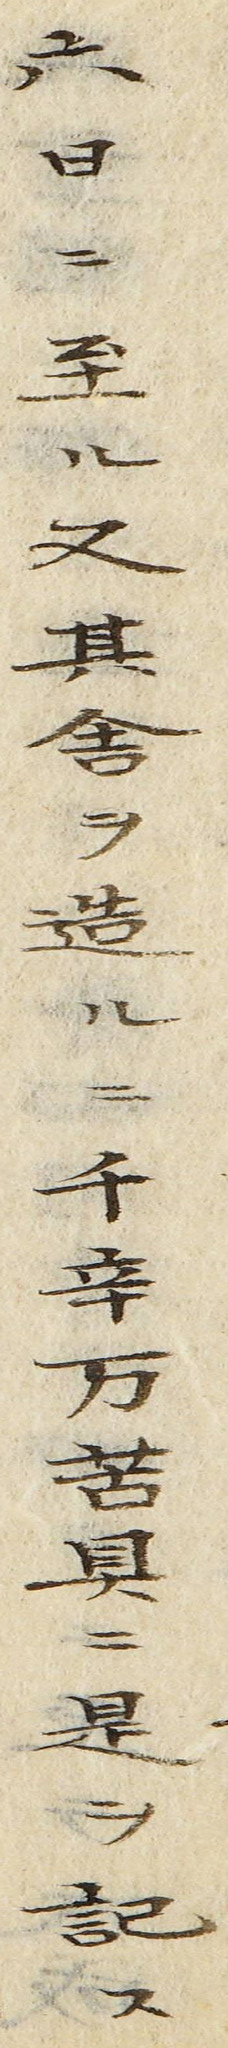六日ニ至ル又其舎ヲ造ルニ千辛万苦具ニ是ヲ記ス
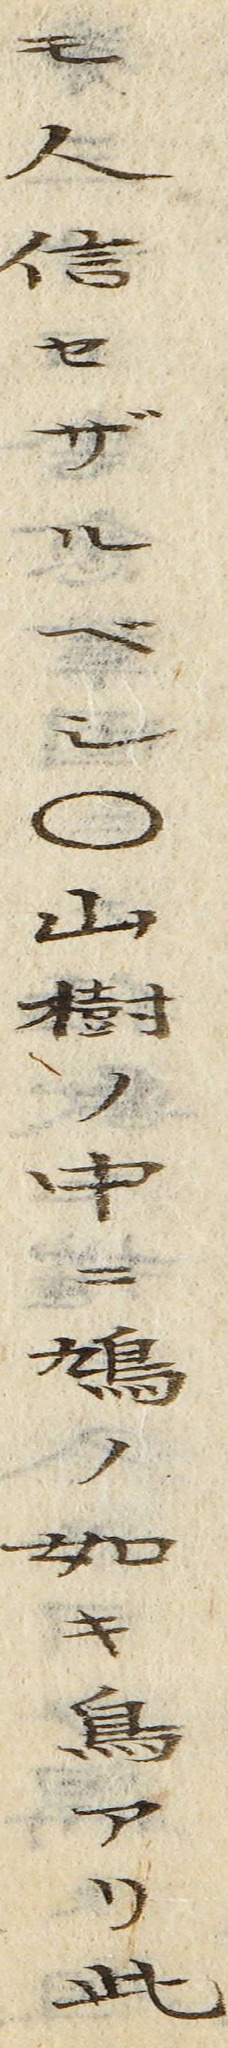モ人信セザルベシ◯山樹ノ中ニ鳩ノ如キ鳥アリ此
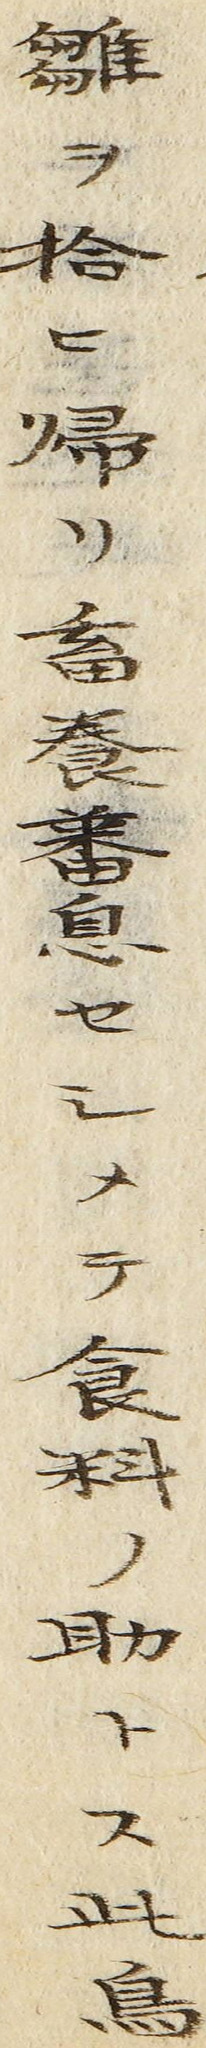雛ヲ拾ヒ帰リ畜養蕃息セシメテ食料ノ助トス此鳥
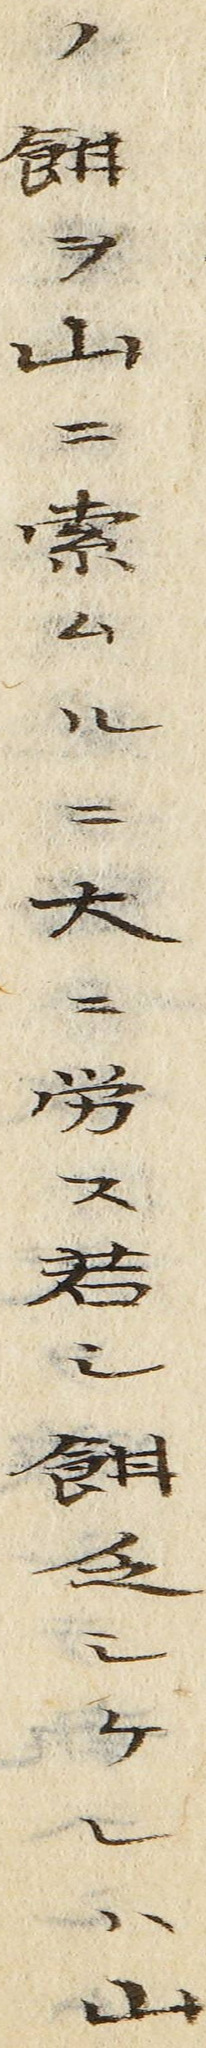ノ餌ヲ山ニ索ムルニ大ニ労ス若シ餌乏シケレハ山
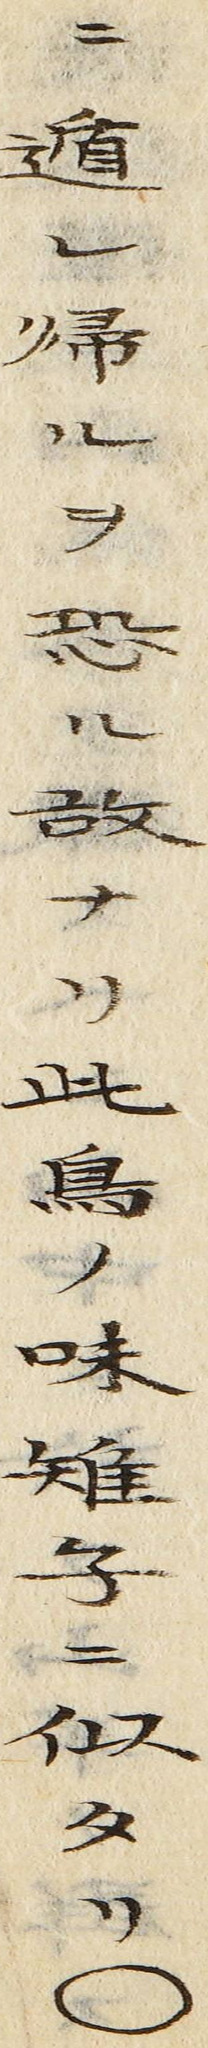ニ遁レ帰ルヲ恐ル故ナリ此鳥ノ味雉子ニ似タリ◯
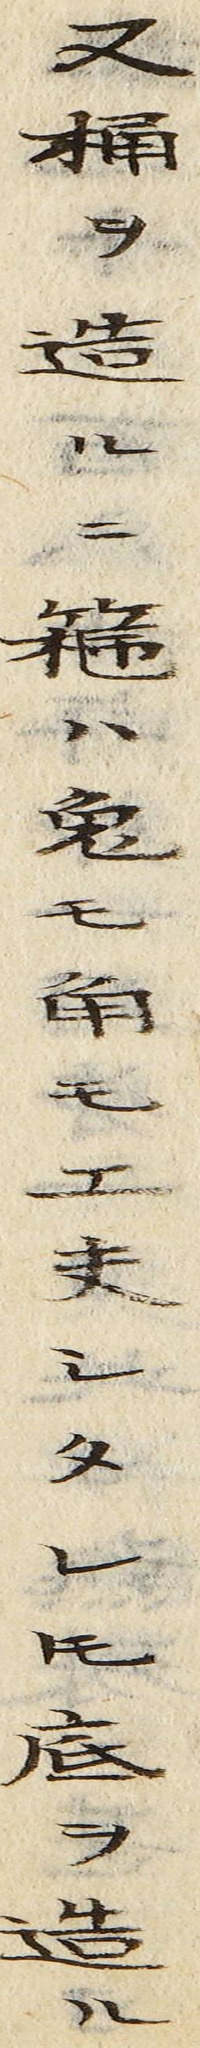又桶ヲ造ルニ箍ハ兔モ角モ工夫シタレトモ底ヲ造ル
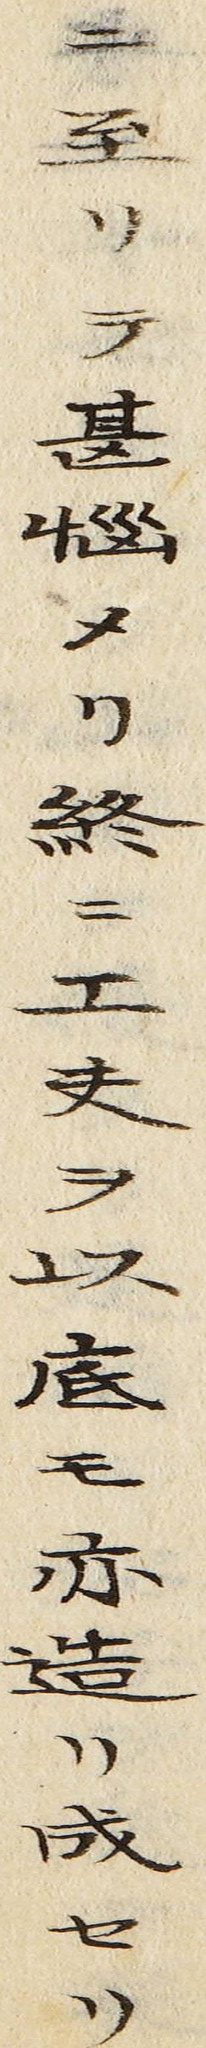ニ至リテ甚悩メリ終ニ工夫ヲ以底モ亦造リ成セリ
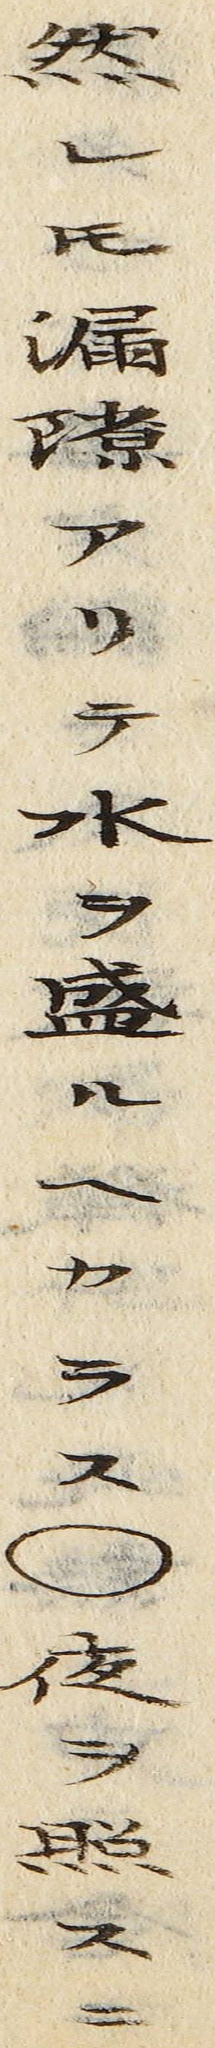然レトモ漏隙アリテ水ヲ盛ルヘカラス◯夜ヲ照スニ
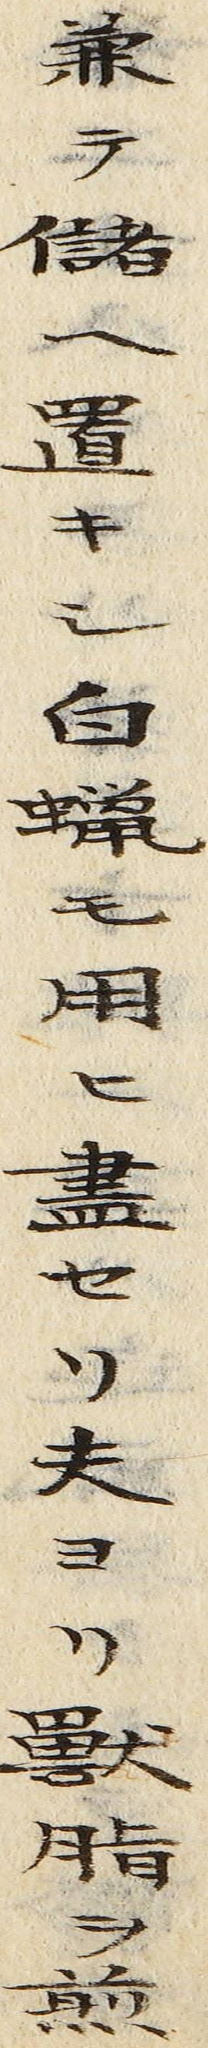兼テ儲ヘ置キシ白蠟モ用ヒ尽セリ夫ヨリ獣脂ヲ煎
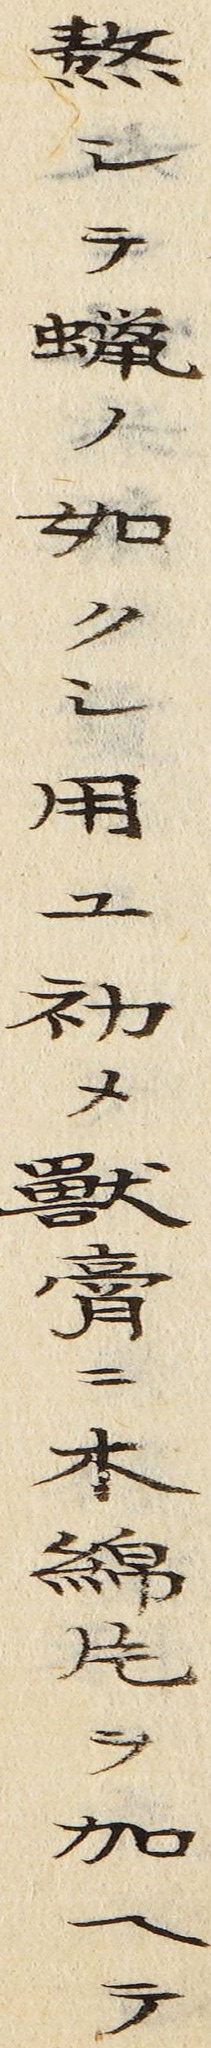熬シテ蝋ノ如クシ用ユ初メ獣膏ニ木綿片ヲ加ヘテ
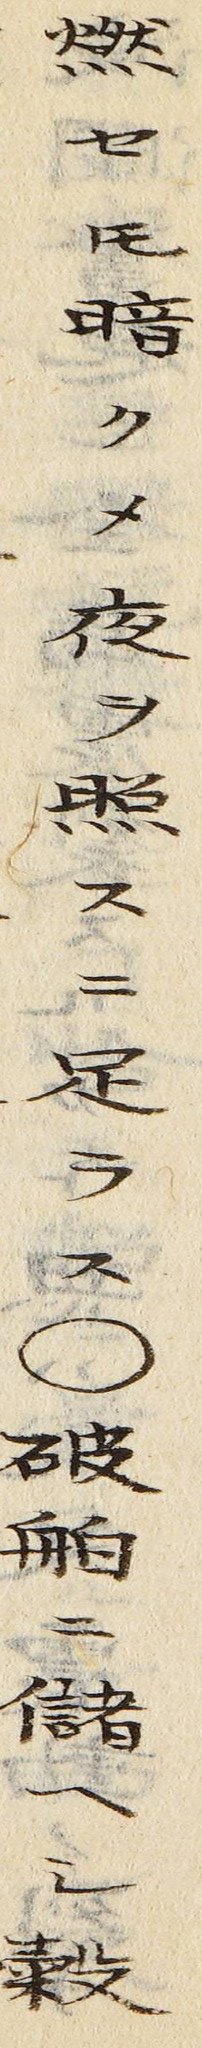燃セトモ暗クシテ夜ヲ照スニ足ラス◯破舶ニ儲ヘシ穀
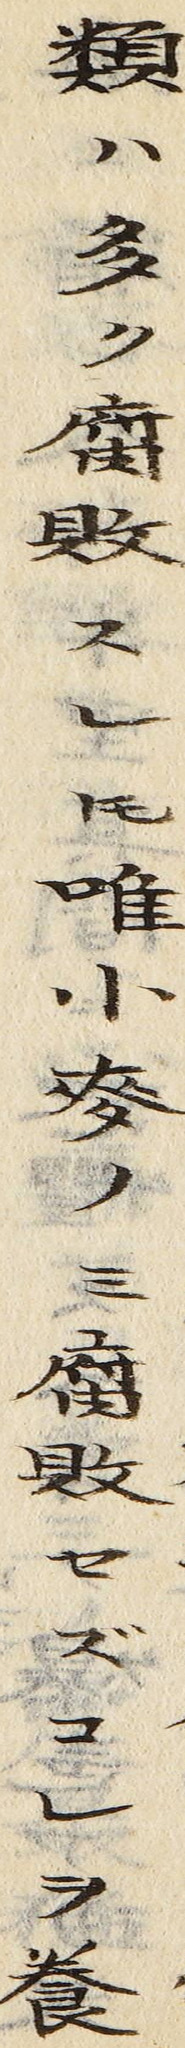類ハ多ク腐敗スレトモ唯小麦ノミ腐敗セズコレヲ養
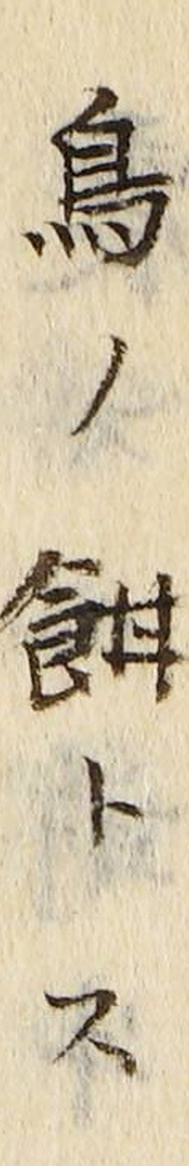鳥ノ餌トス
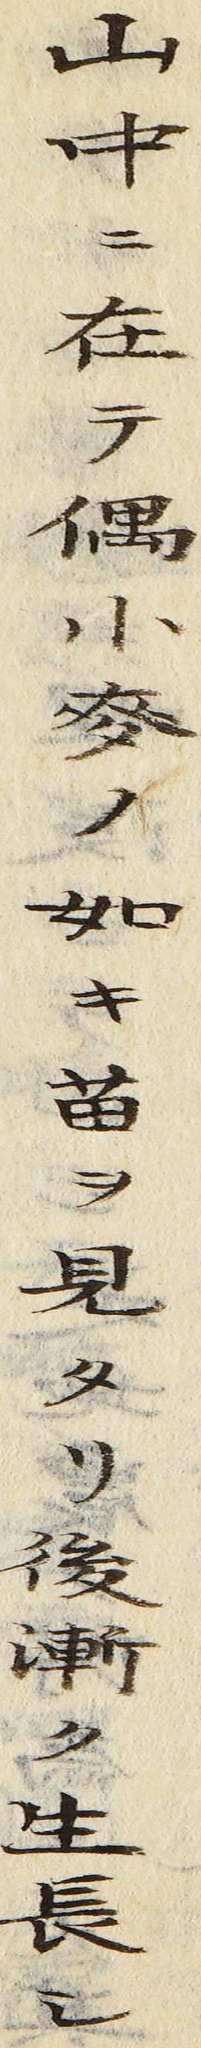山中ニ在テ偶小麦ノ如キ苗ヲ見タリ後漸ク生長シ
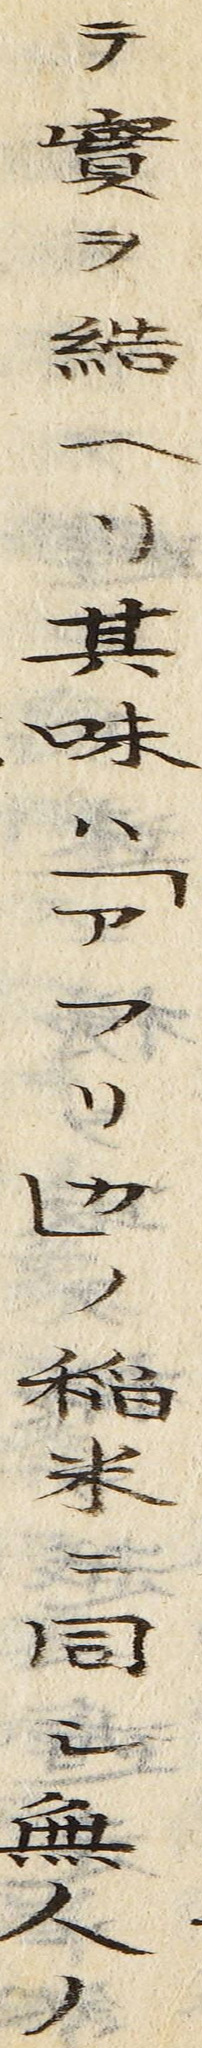テ実ヲ結ヘリ其味ハ「アフリカ」ノ稲米ニ同シ無人ノ
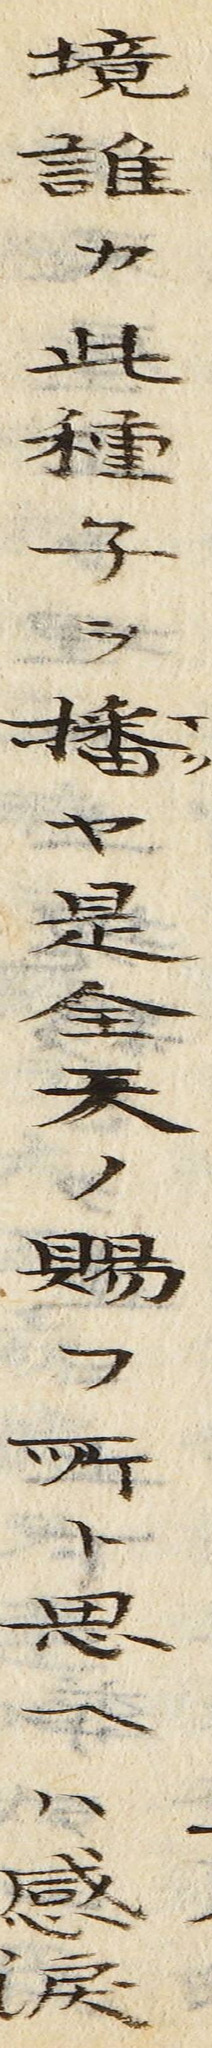境誰カ此種子ヲ播ヤ是全天ノ賜フ所ト思ヘハ感涙
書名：漂流紀事
